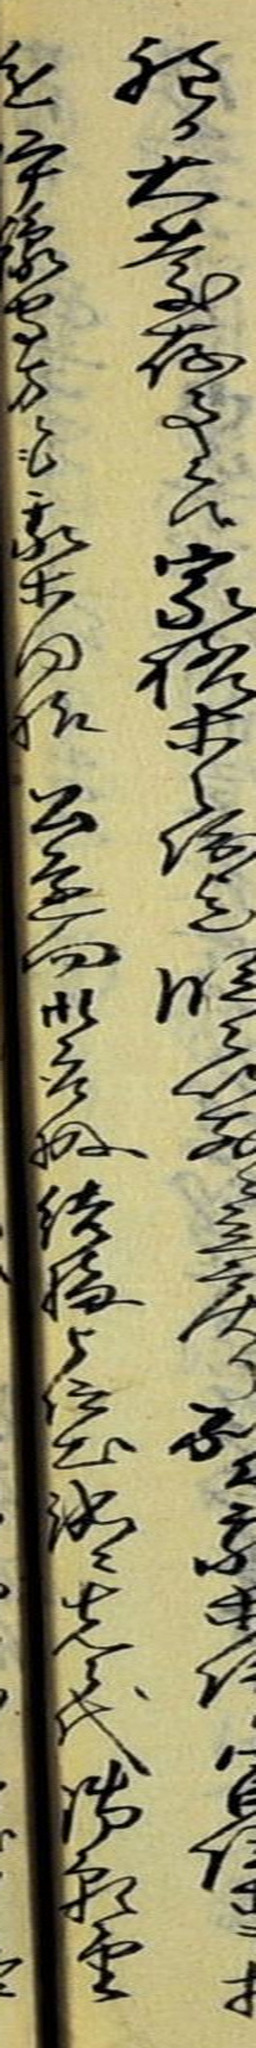進伊予守方ニも我等同様公辺向御取扱結構被仰出誠ニ先々代御願望
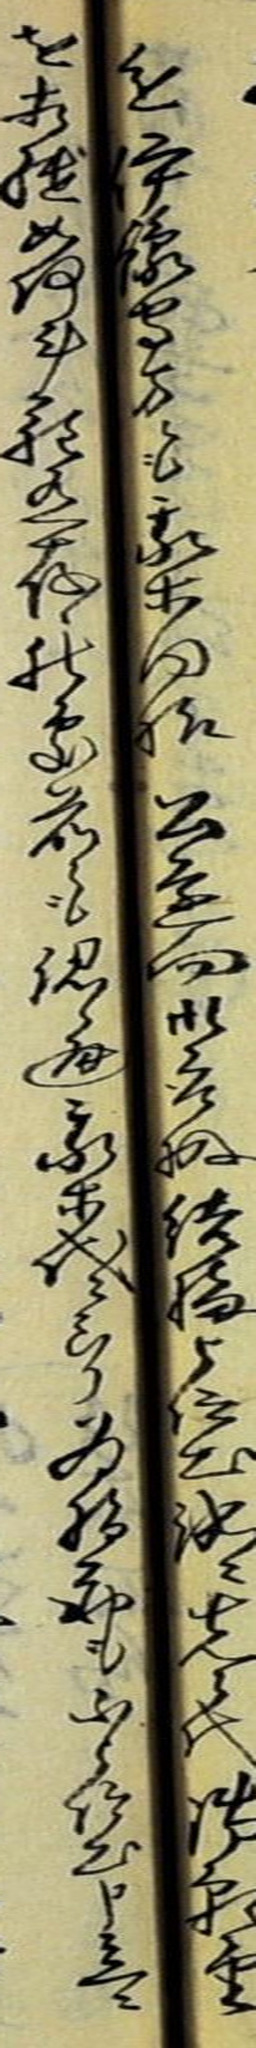を相継如何斗難有存候然処前々も認候通我等代ニ至り為指勤も不被仰出申立ニ

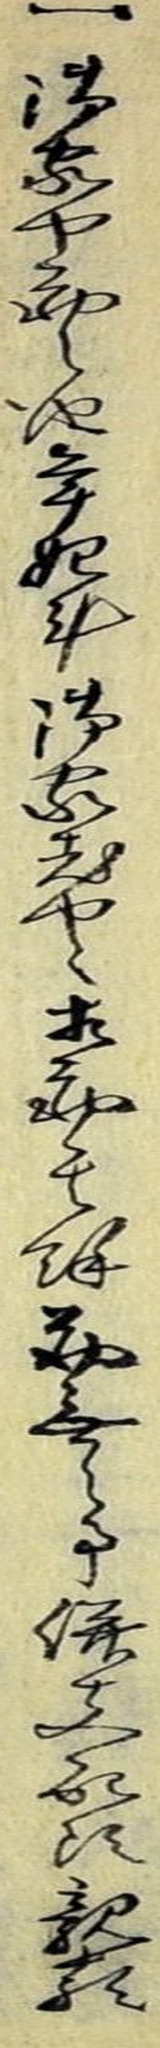一御家中勤之儀年始斗御家老中へ相勤其余勤無之事併支配頭親類
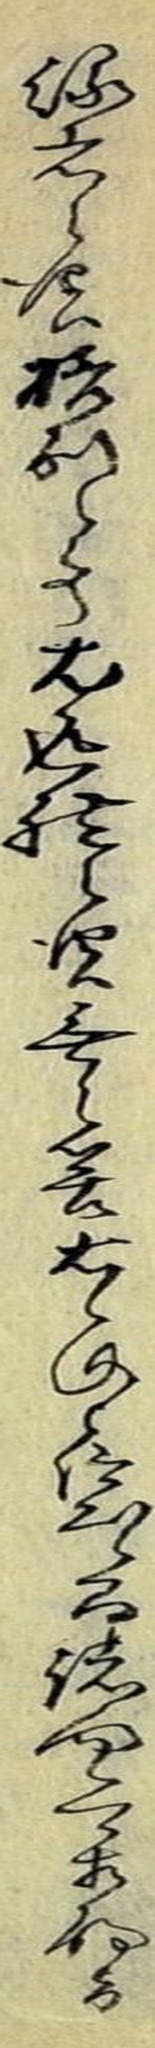縁者之儀ハ格別之事尤返礼之儀ハ無之筈右之趣被仰出候間諸向へ可相触旨
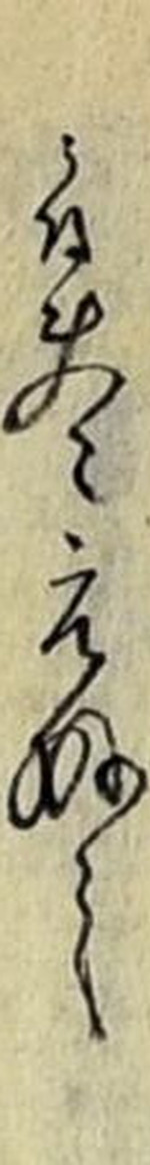ニ付夫々取扱之
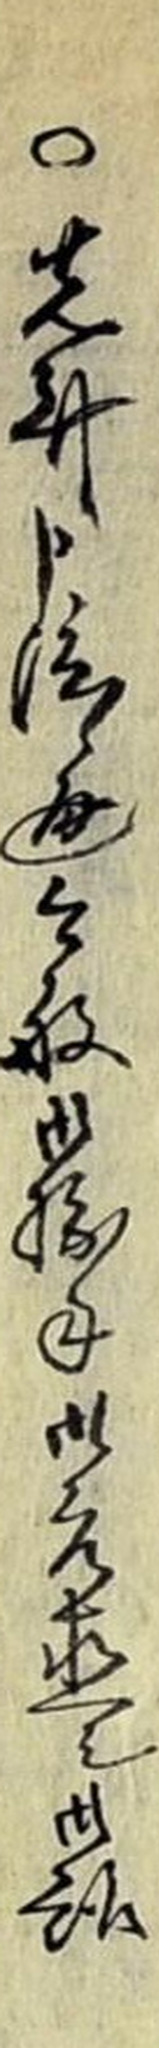〇先刻申渡候通今般御勝手御取直シ御趣
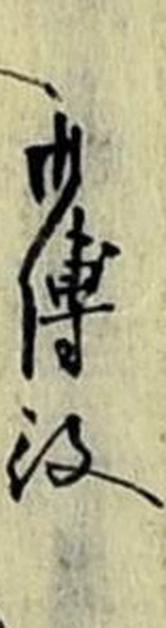御傅役
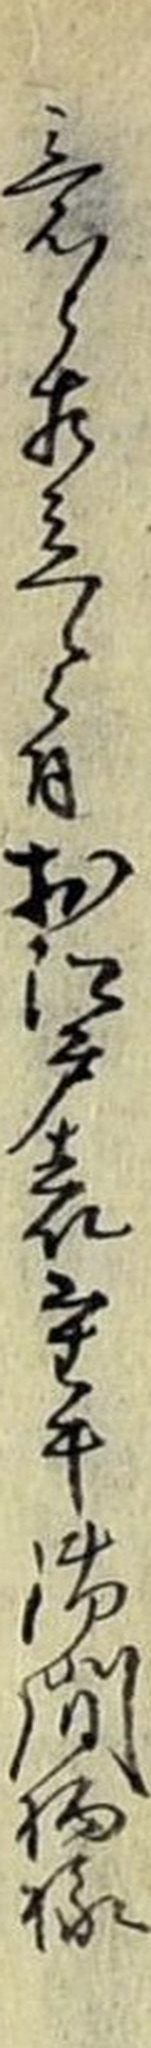意被相立候ニ付於江戸表重キ御間柄様
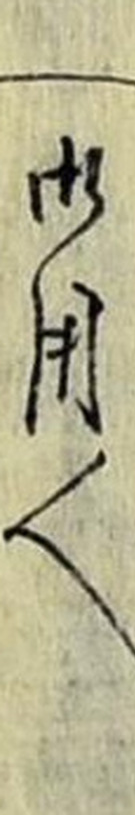御用人
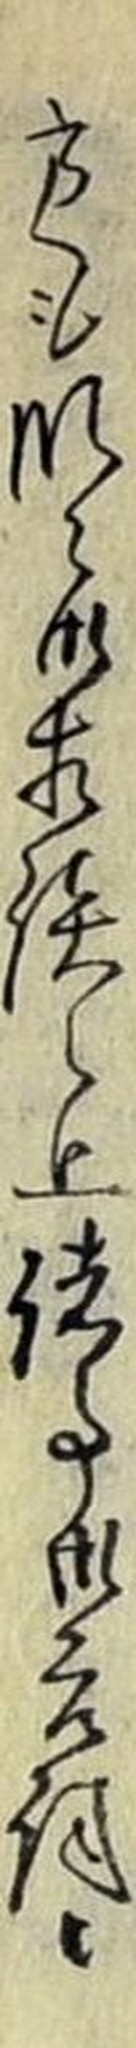方へも段々御相談之上諸事御取調被
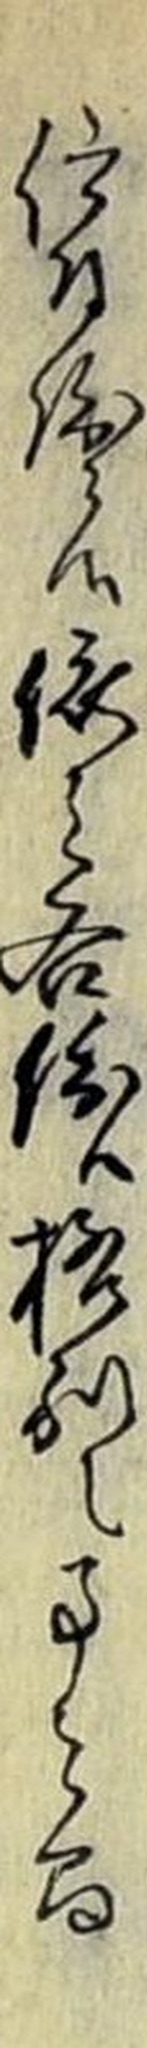仰付儀ニ候依之各儀ハ格別之事ニ候間
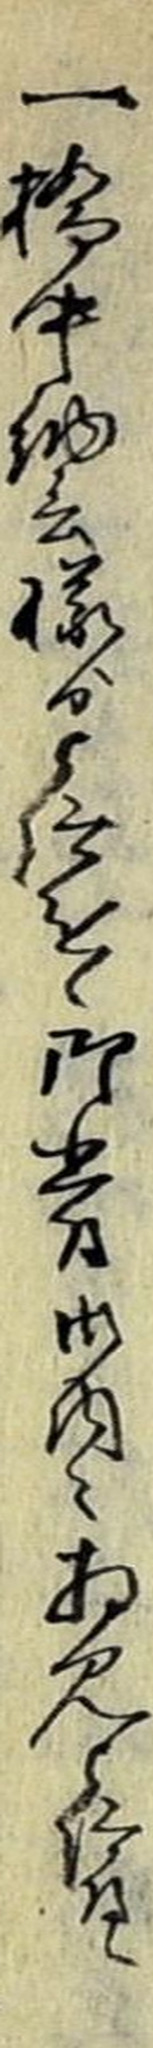一橋中納言様ゟ被仰進候御書付御内々拝見被仰付候
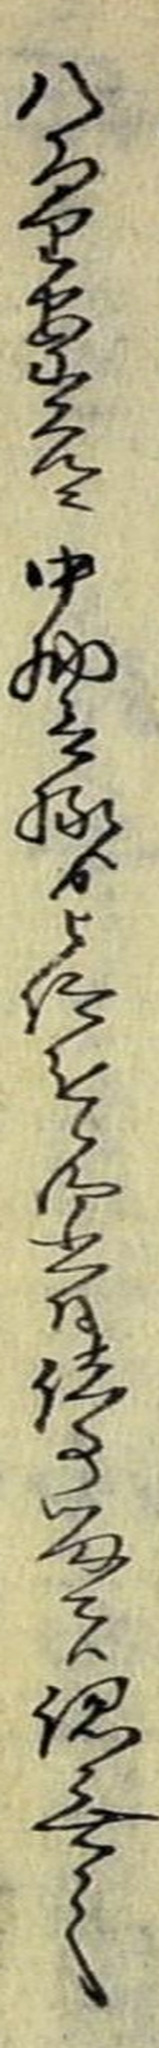八百里案スルニ中納言様ゟ被仰進候御書付諸事留ニハ認無之
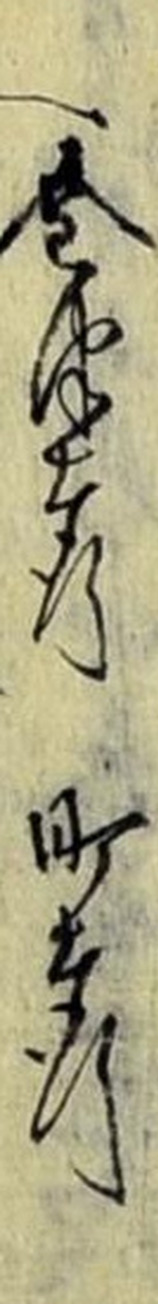金津奉行町奉行
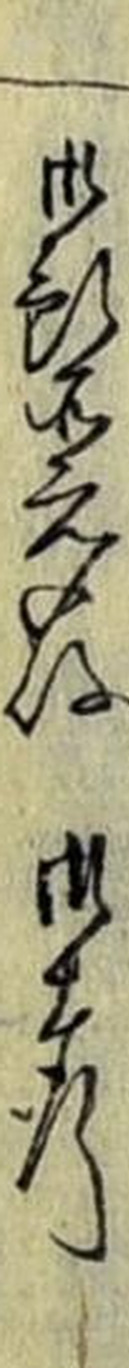御預所元〆役御奉行
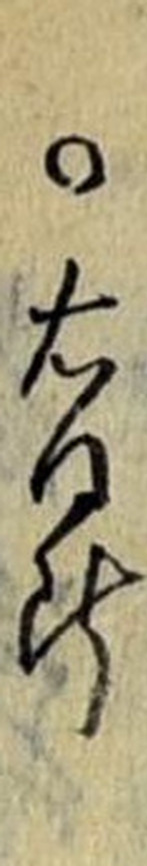〇右同断
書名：命令之部 三
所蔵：福井県文書館 Fukui Prefectural Archives
